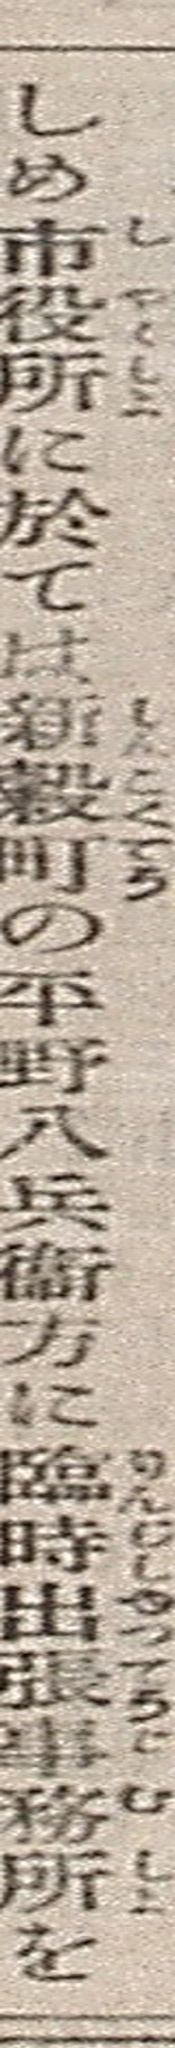しめ市役所に於ては新穀町の平野八兵衛方に臨時出張事務所を
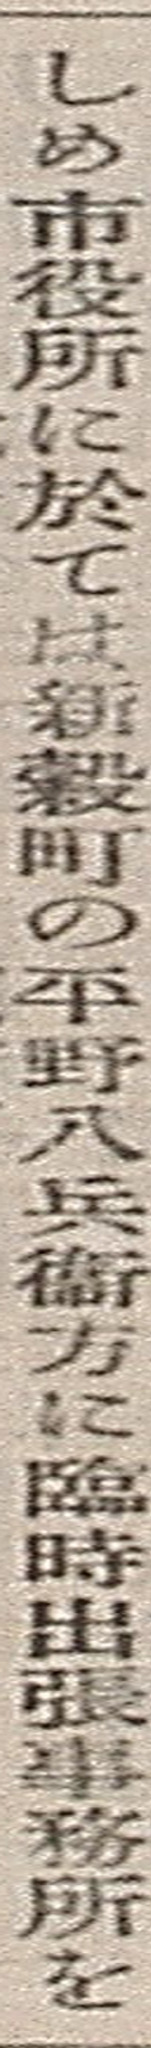しめ市役所に於ては新穀町の平野八兵衛方に臨時出張事務所を
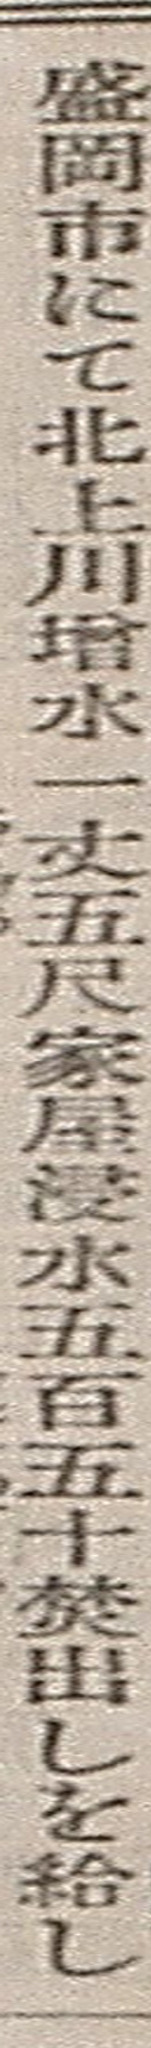盛岡市にて北上川増水一丈五尺家屋浸水五百五十焚出しを給し
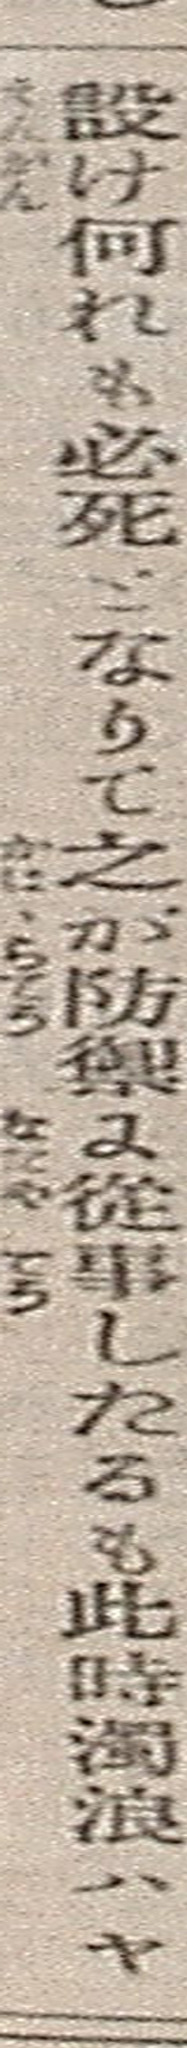設け何れも必至となりて之が防禦に従事したるも此時濁浪ハヤ
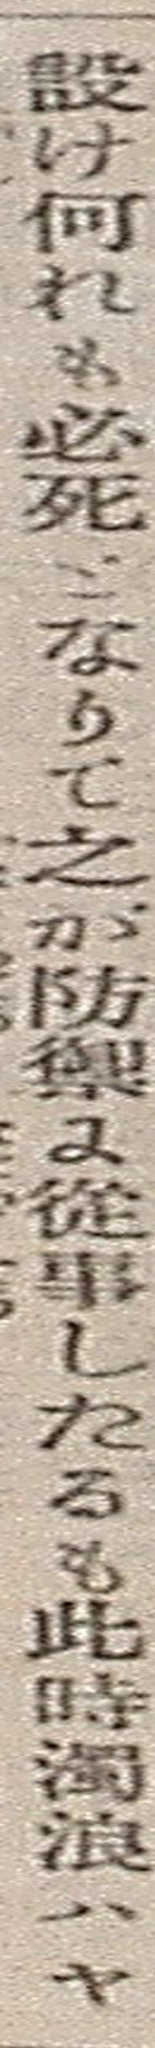設け何れも必至となりて之が防禦に従事したるも此時濁浪ハヤ
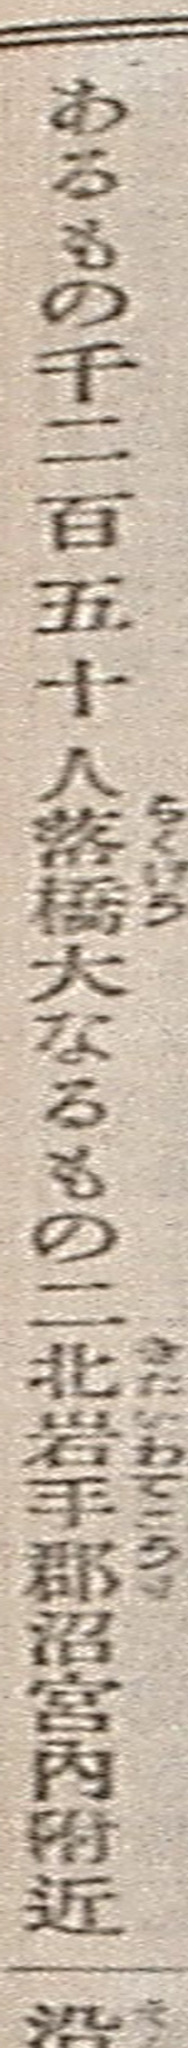ゐるもの千二百五十人落橋大なるもの二北岩手郡沼宮内附近
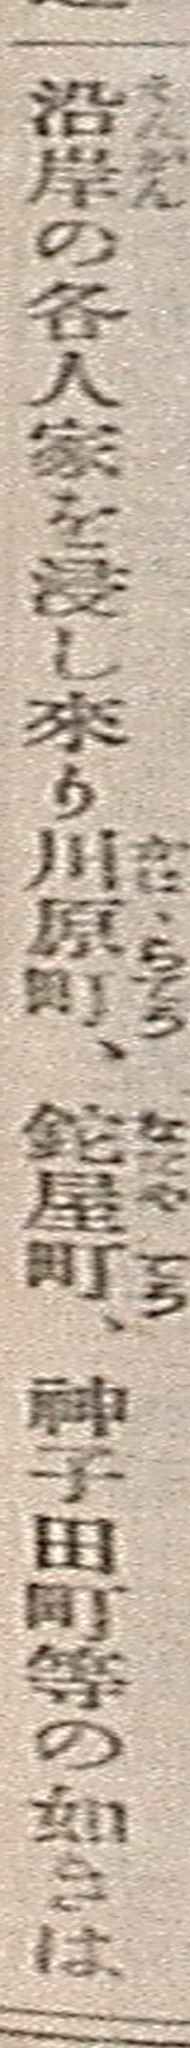沿岸の各人家を浸し来り川原町、鉈屋町、神子田町等の如きは

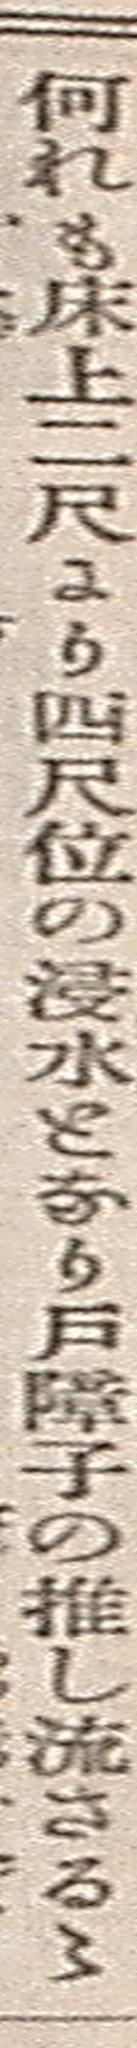何れも床上二尺より四尺位の浸水となり戸障子の推し流さるゝ
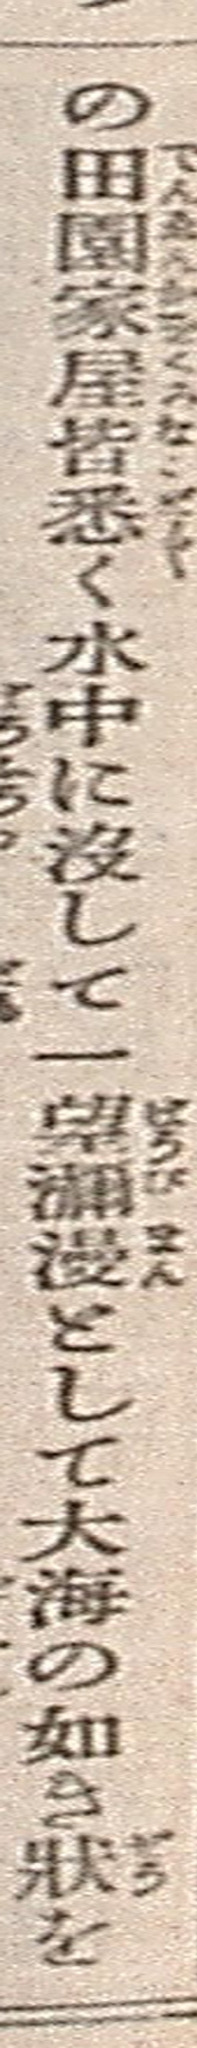の田園家屋皆悉く水中に没して一望湖漫として大海の如き状を
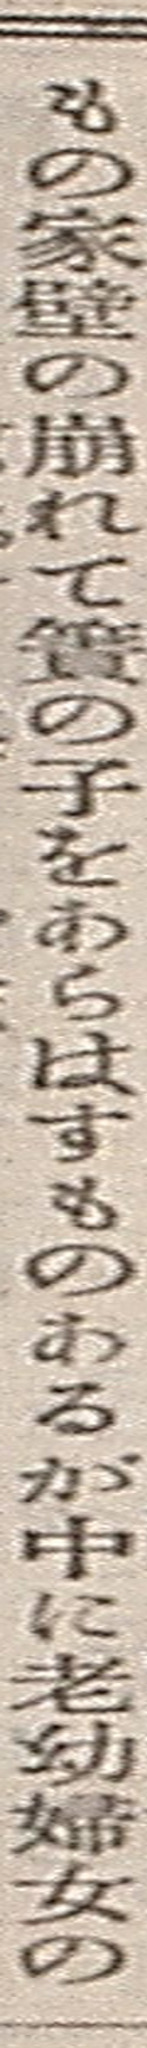もの家壁の崩れて簀の子をあらわすものあるが中に老幼婦女の
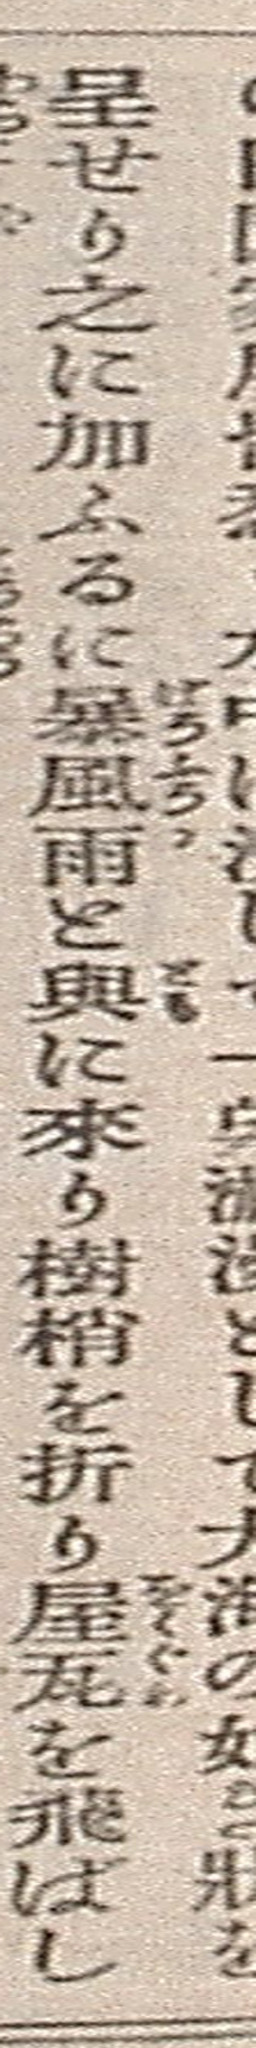呈せり之に加ふるに暴風雨と輿に来り樹梢を折り屋瓦を飛ばし
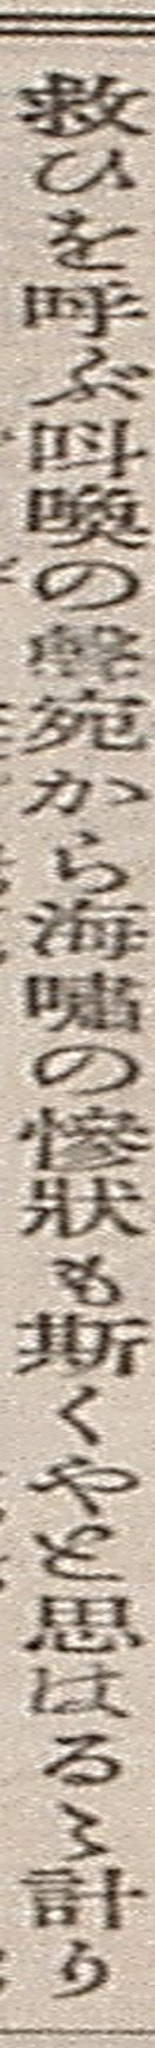救ひを呼ぶ叫喚の声宛から津嘯の惨状も斯くやと思はろゝ計り
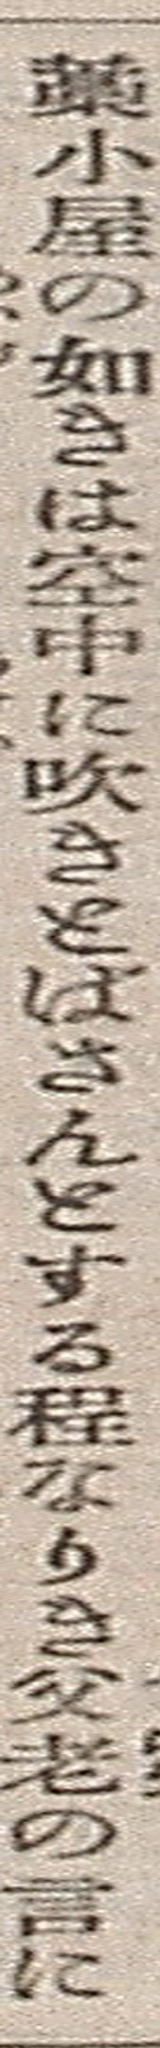藁小屋の如きは空中に吹きとばさんとする程なりき父老の言に
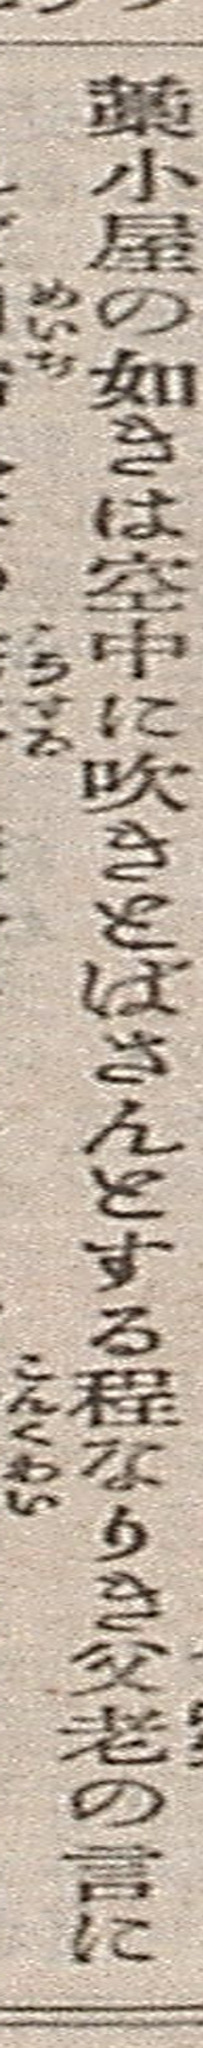藁小屋の如きは空中に吹きとばさんとする程なりき父老の言に
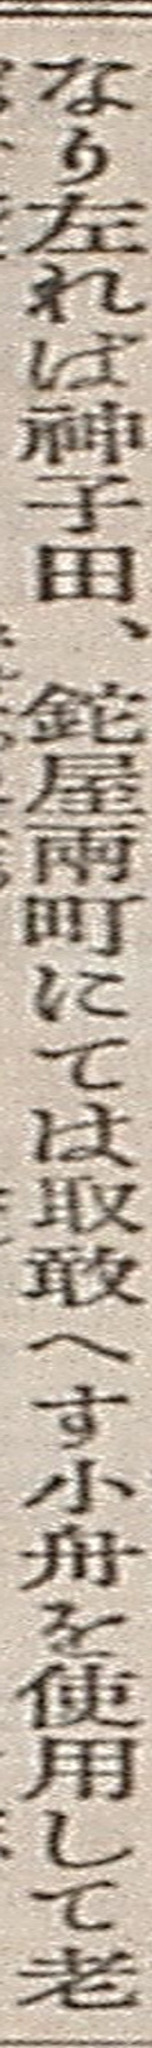なり左れば神子田、鉈屋両町にては取敢へず小舟を使用して老
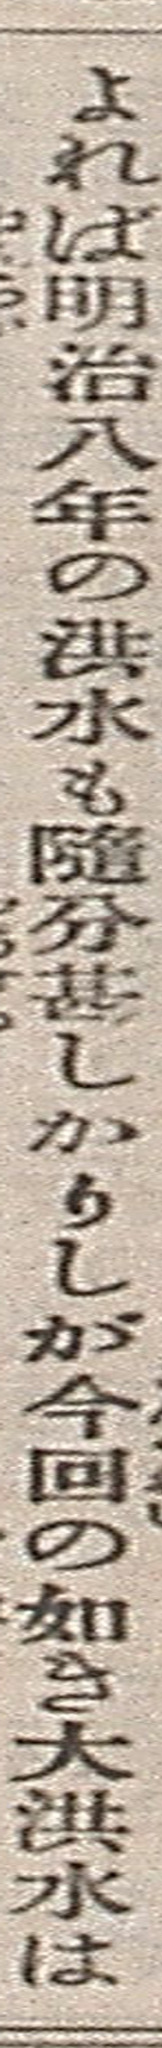よれば明治八年の洪水も随分甚しかりしが今回の如き大洪水は
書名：風俗畫報臨時増刊第百二十八號　洪水被害録（下）
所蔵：東京大学地震研究所図書室 Earthquake Research Institute Library, The University of Tokyo, JAPAN
